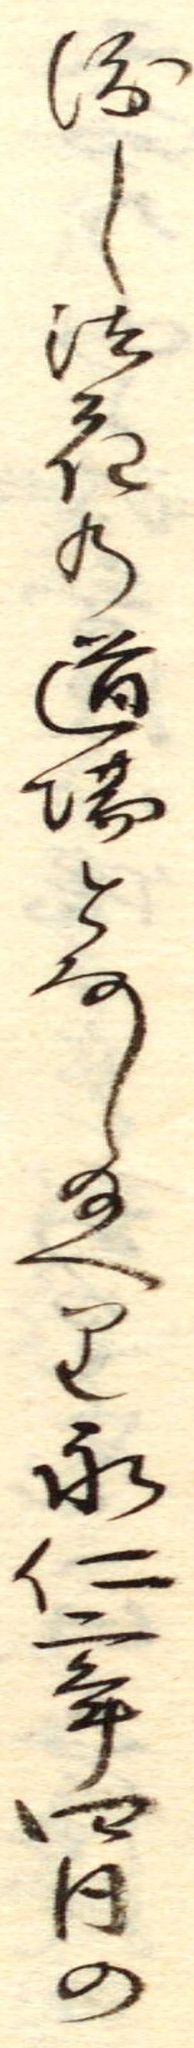渡し法花の道場となし給へり永仁二年四月の
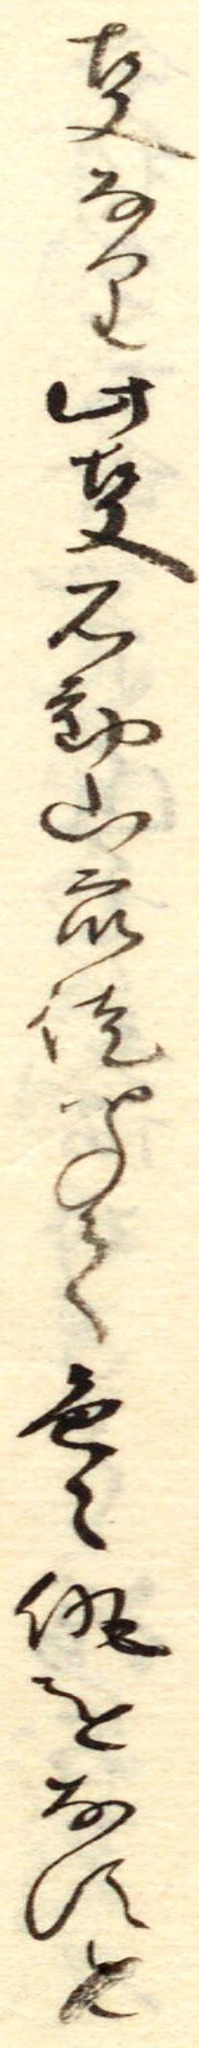事なり此事石動山衆徒聞て色々仇をなすと
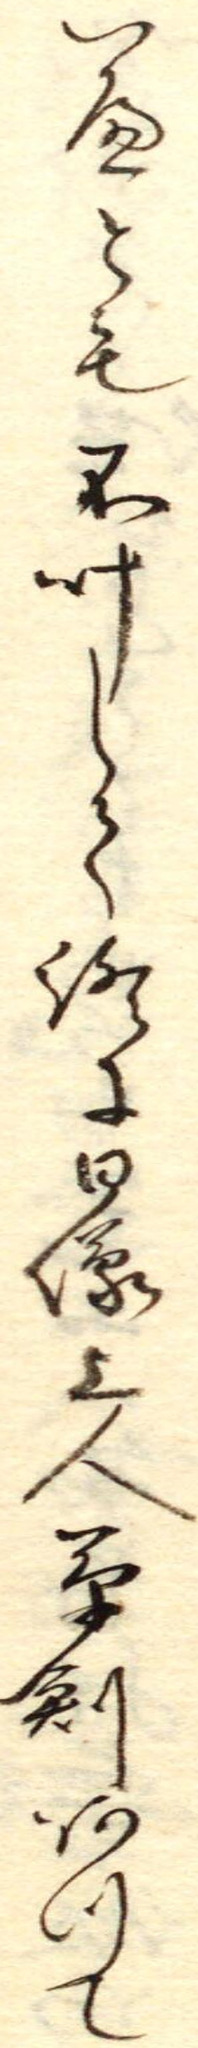いへとも不叶して終に日像上人草創あつて
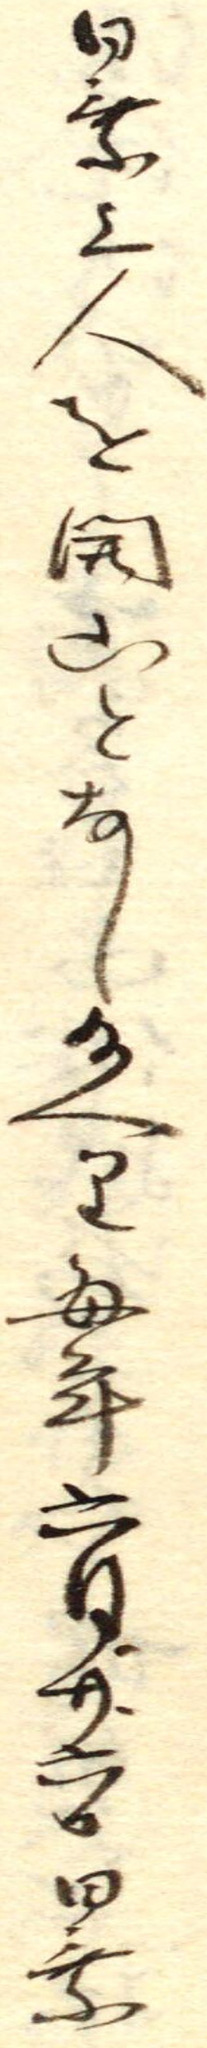日乗上人を開山となし給へり毎年六月廿六日日乗
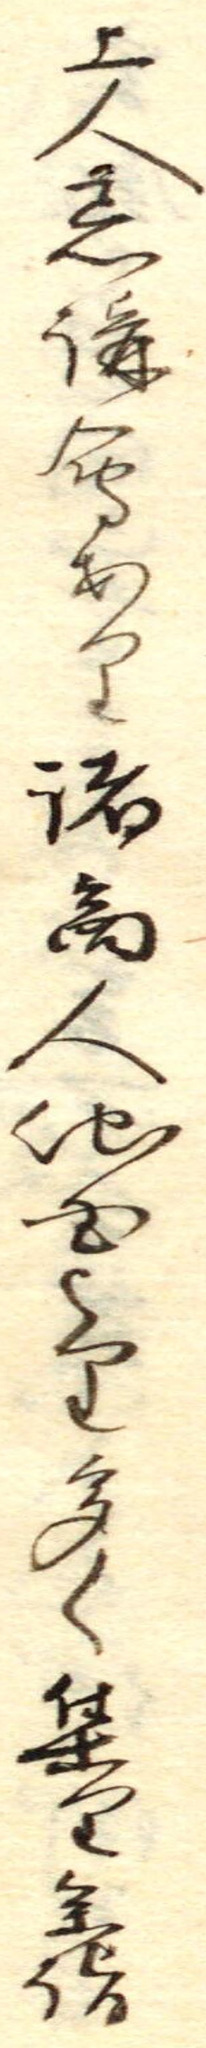上人忌講会あり諸商人他国より多く集り参詣
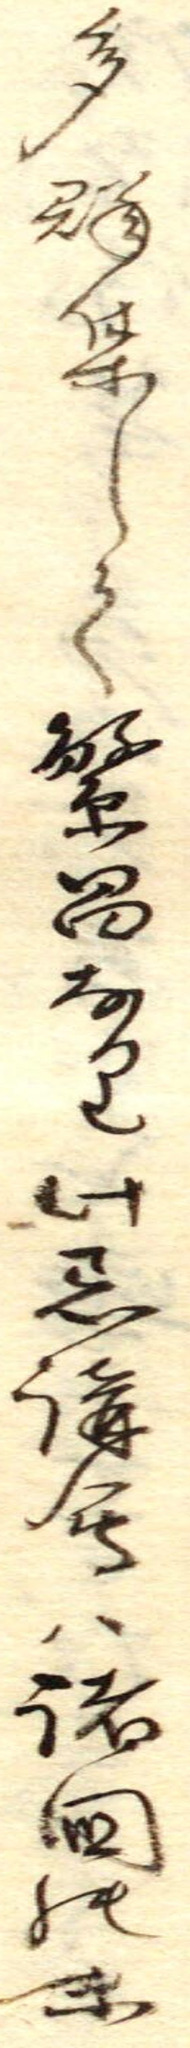多群集して繁昌なり此忌講会は諸国の末

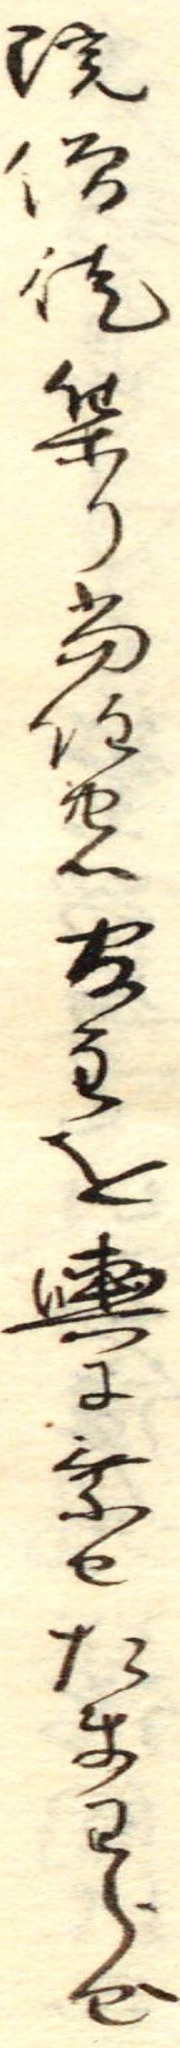院僧徒集り当住の官主を輿に乗せたまわらせ
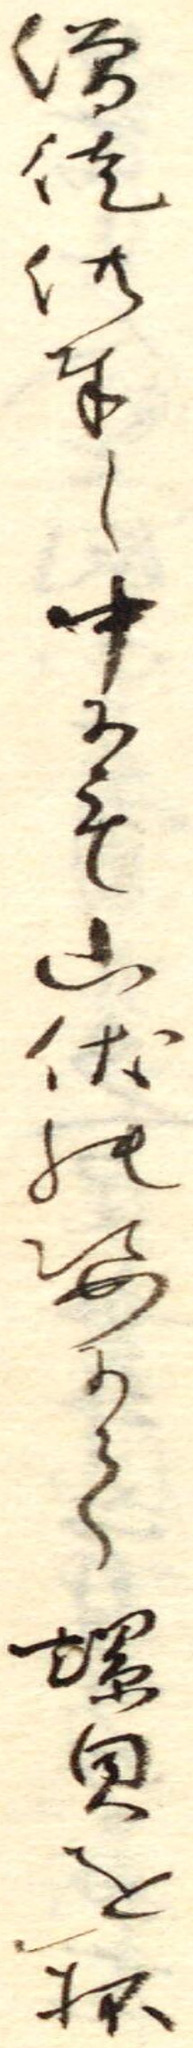僧徒供奉し中にも山伏の姿にて螺貝を抔
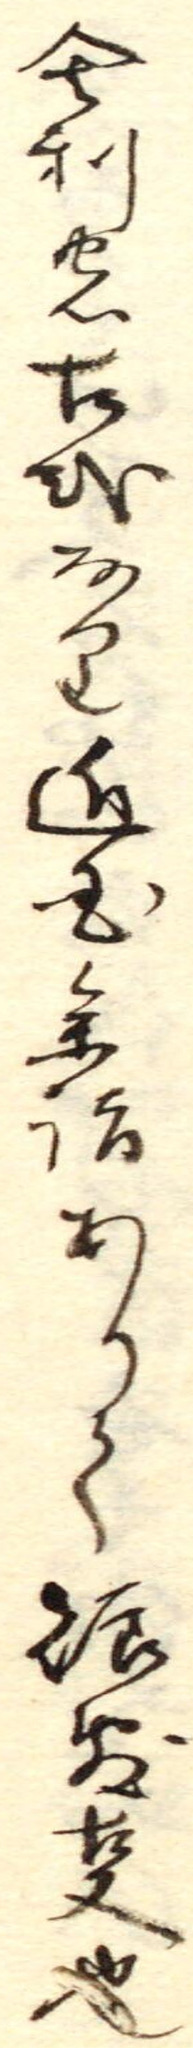舎利の古式なり近国参詣ありて賑敷事也
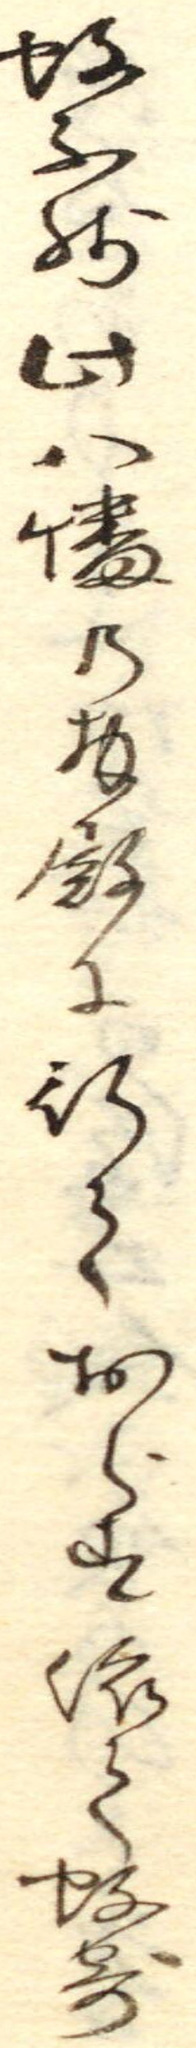蚊不残此八幡の拝殿に行ておらす依之蚊寄
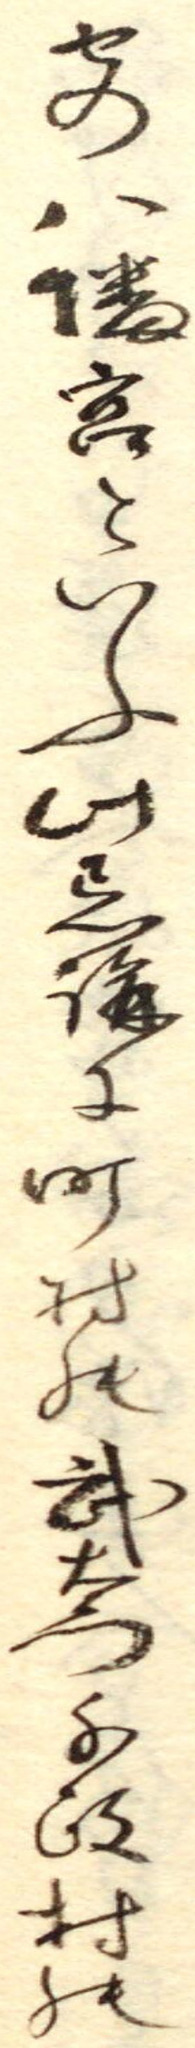せの八幡宮といふ此忌講に町村の武右衛門千路村の
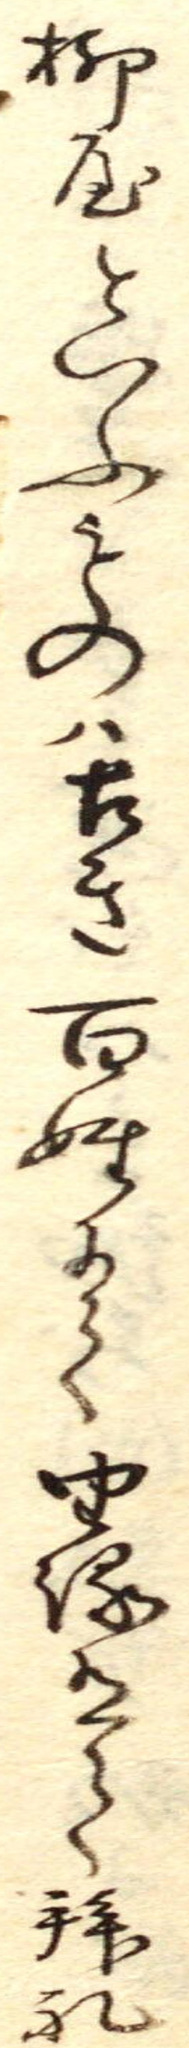柳屋といふものは古き百姓にて由縁有て拝礼
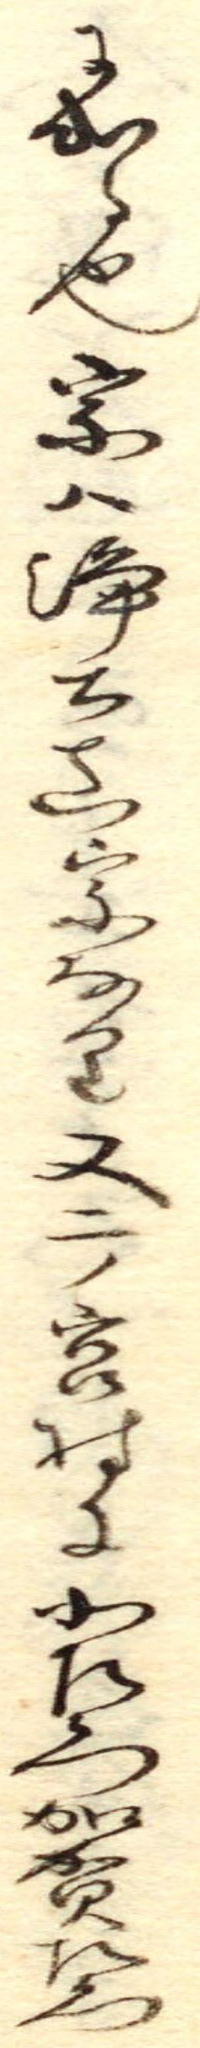に出る也宗は浄土真宗なり又二ノ宮村に北左衛門加賀左衛門
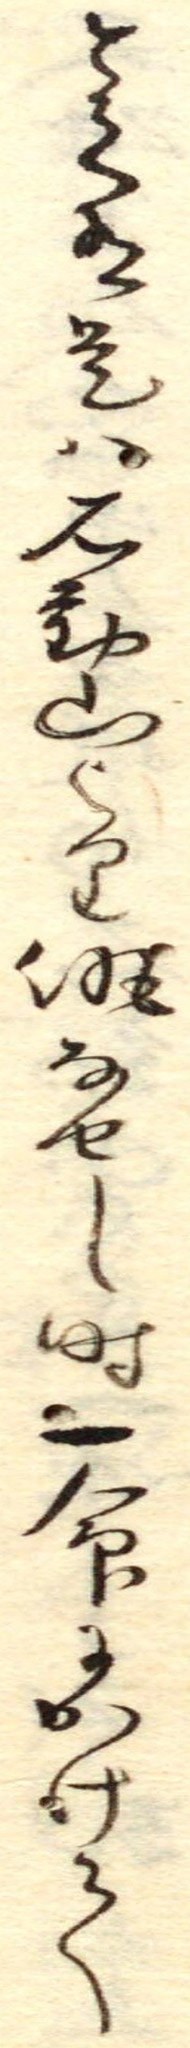とて有是は石動山より仇なせし時一命にかけて
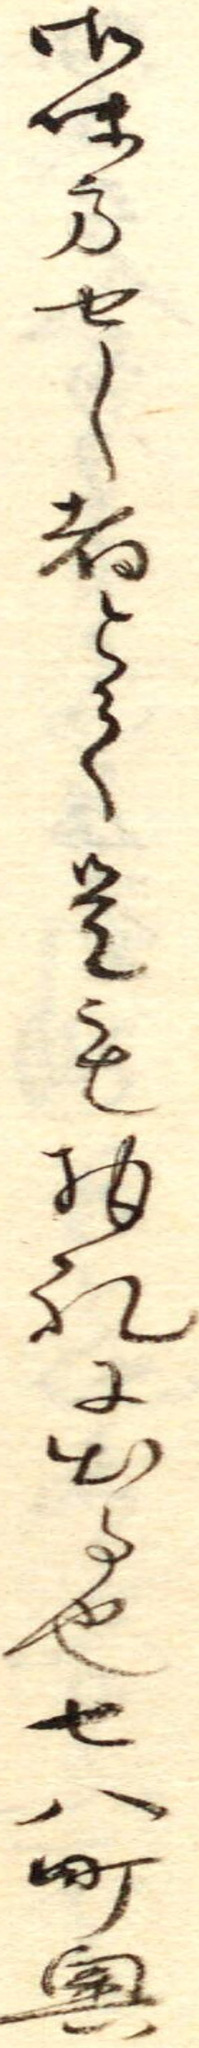御味方せし者とて是も拝礼に出る也七八町奥
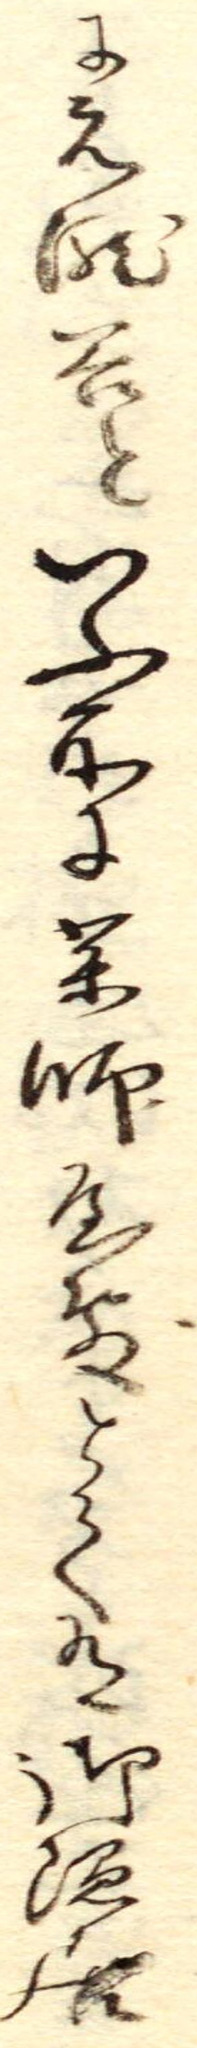に元瀧谷といふ所に薬師屋敷とて有御隠居
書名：能登名跡誌
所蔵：Ishikawa Prefectural Library
